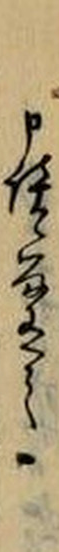申談候留有之
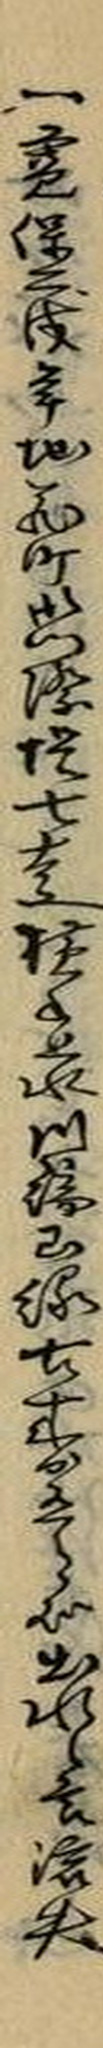一寛保二戌年地蔵町御門際堤七太夫横手上水川端玉縁古来ゟ有之候処出水之節流失
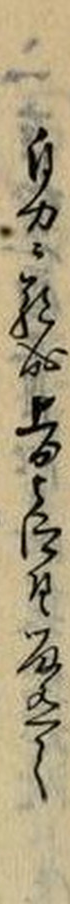自力に難成上ゟ被仰付候留有之
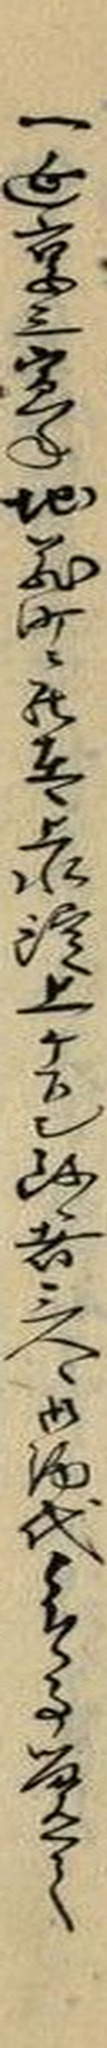一延享三寅年地蔵町に罷在候上水淀上ケ下シ致候者三人へ御酒代被下候事留有之
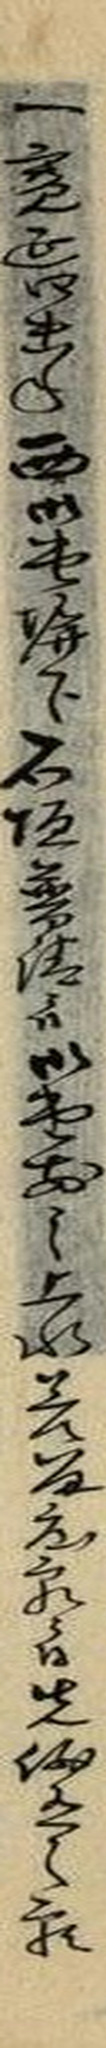一寛延四未年西御堂塀下石垣普請に付御堂前之上水差留度願に付先例有之願
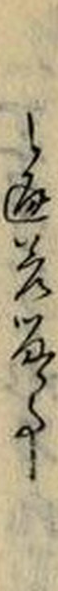之通差留候事
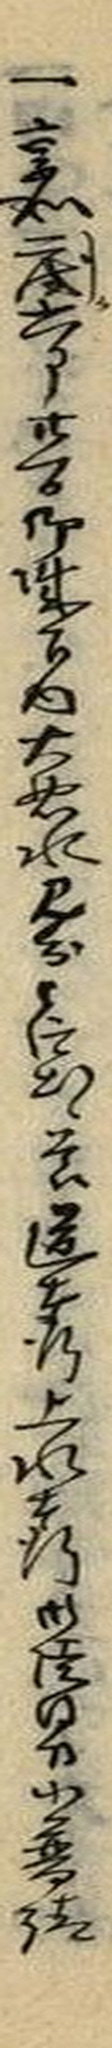一享和二戌六月廿一日御城下内大悪水見分被仰出候節道奉行上水奉行御徒目付小普請
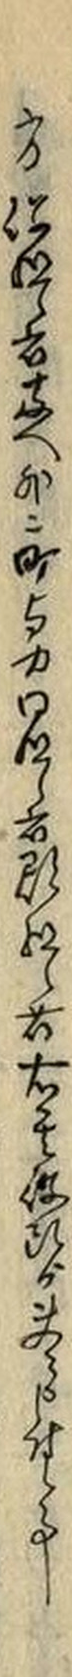方役組之者両人外に町与力同組之者郡組之者右其役頭ゟ夫々申付候事
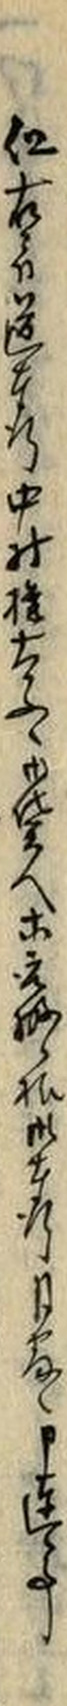但右に付道奉行中村権大夫へ御貸人等取扱候様御奉行月番へ申達候事
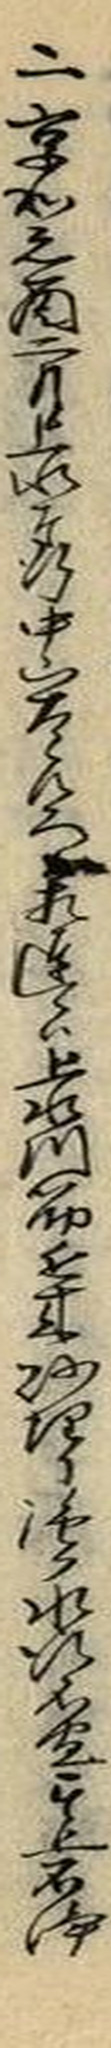一享和元酉二月上水奉行中山太郎左衛門ゟ相達候は上水川筋近来砂埋り強ク水行不宜其上不浄
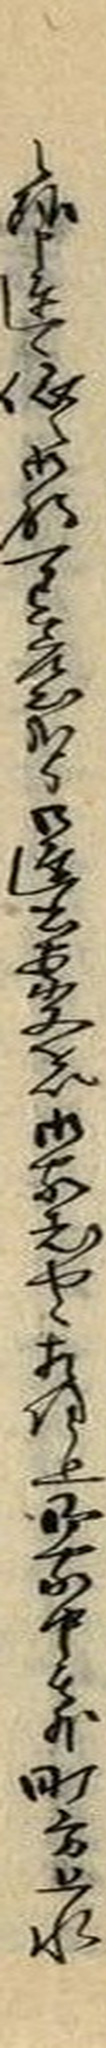之趣申達候依之御触可被差出哉と御達書案文を以御家老中へ相伺候上御家中其外町方上水
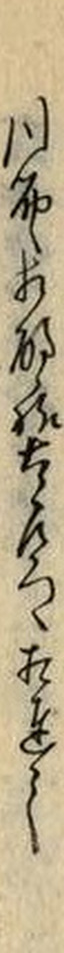川筋へ相触候様太郎左衛門へ相達之
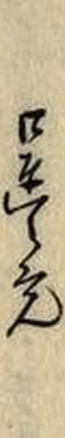口達之覚
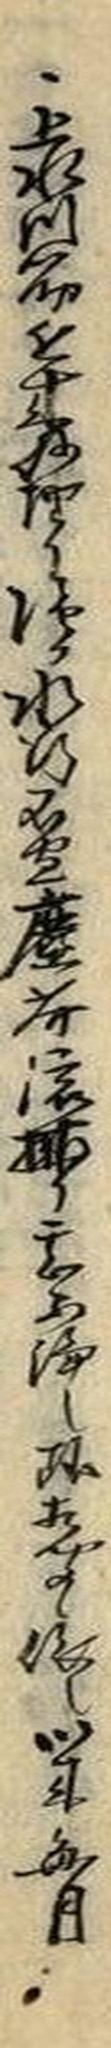・上水川筋近来砂埋り強ク水行不宜塵芥流掛り甚不浄之趣相聞候依之以来毎月
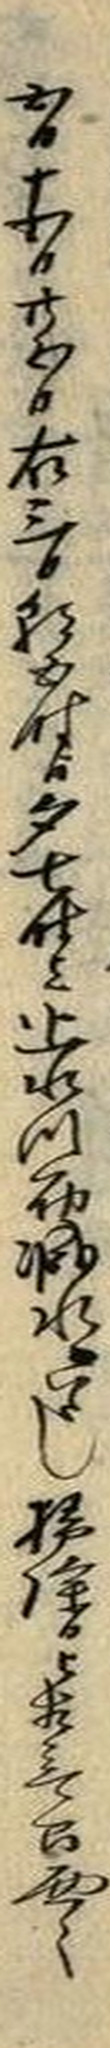五日十五日廿五日右三日朝五時ゟ夕七時迄止水川筋減水にいたし掃除日被相立候間面々
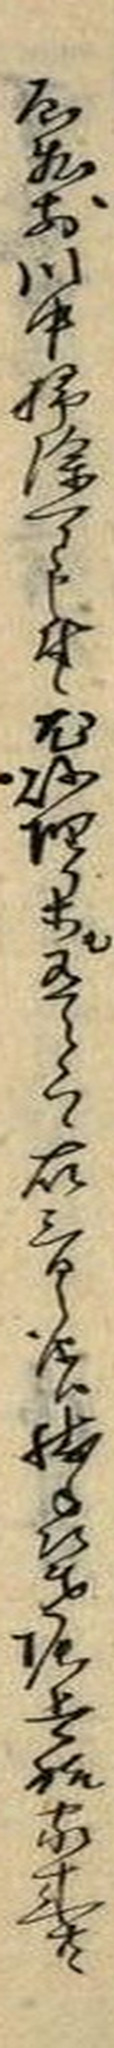屋敷前川中掃除可被申付候尤砂埋り等も有之候はゝ右三日之儀は勝手次第堀上候様家来共へ
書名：御城下諸事之部
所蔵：福井県文書館 Fukui Prefectural Archives
